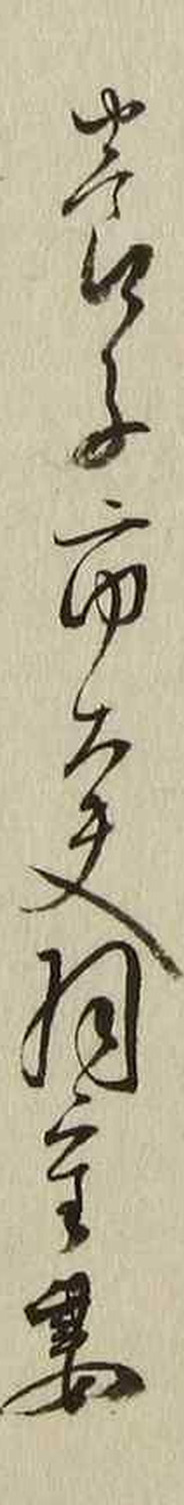女養子市太夫羽重妻
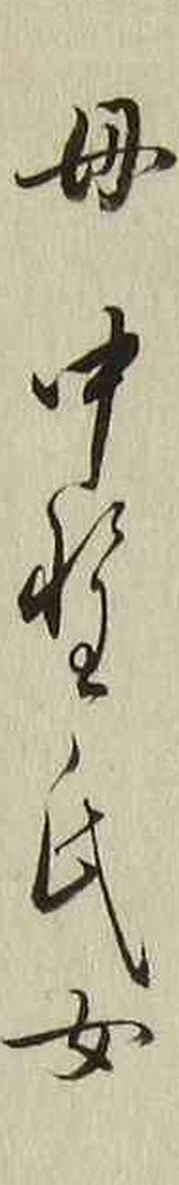母中野氏女
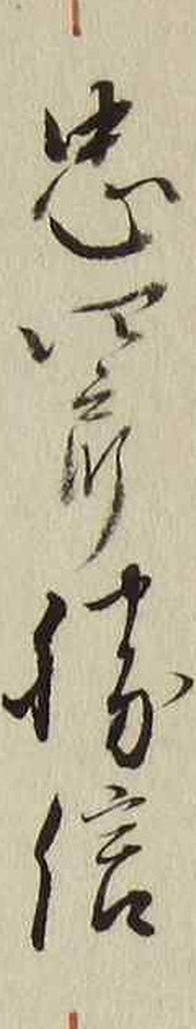忠四郎勝信
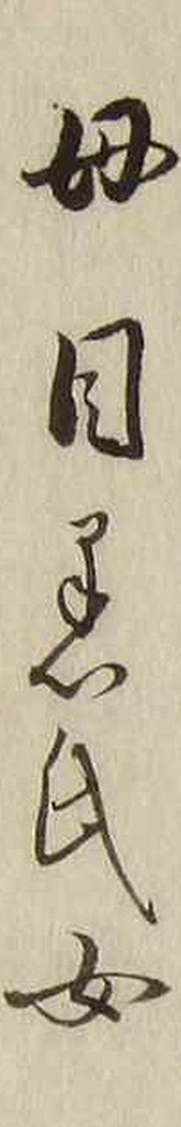母目黒氏女
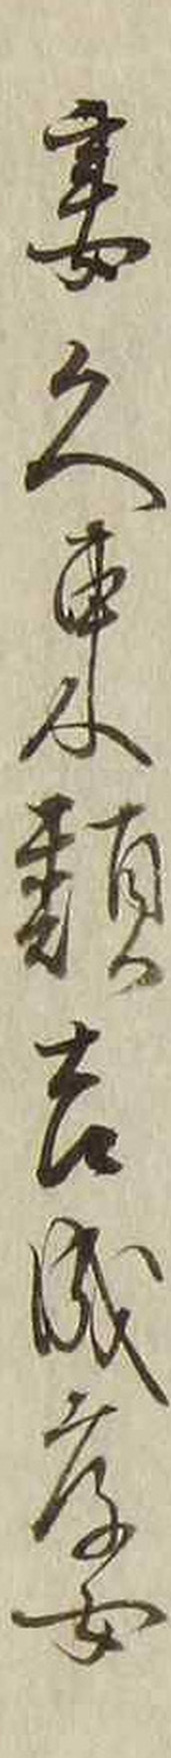妻久東類吉成孝女

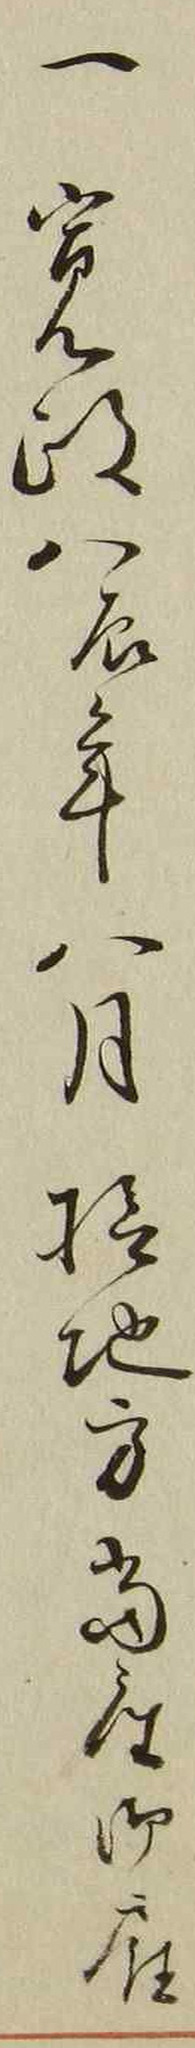一寛政八辰年八月検地方当座御雇
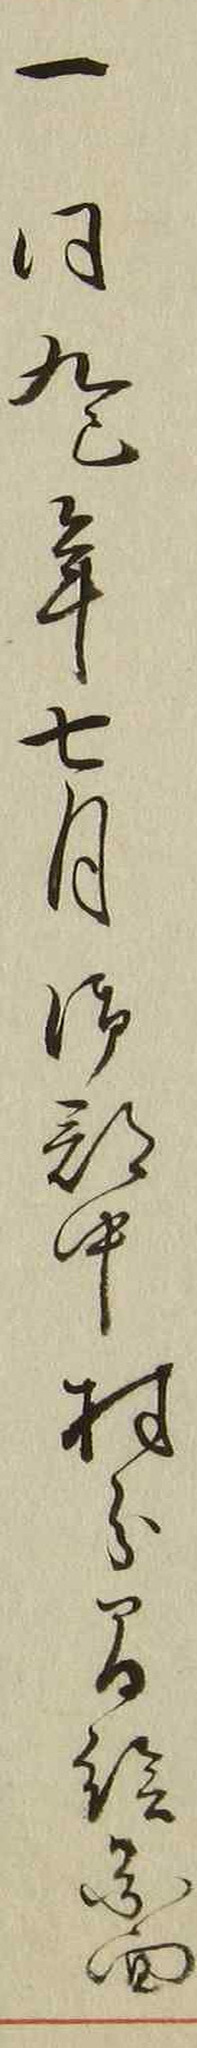一同九巳年七月御部中村分間絵図面
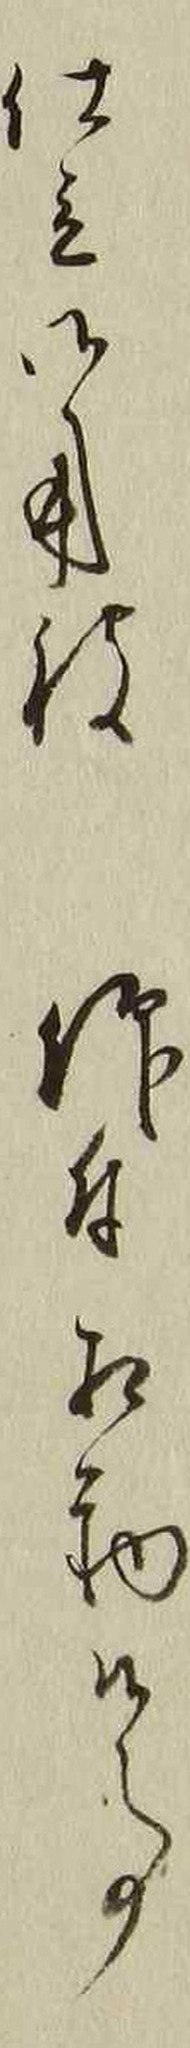仕立御用被仰付相勤候事
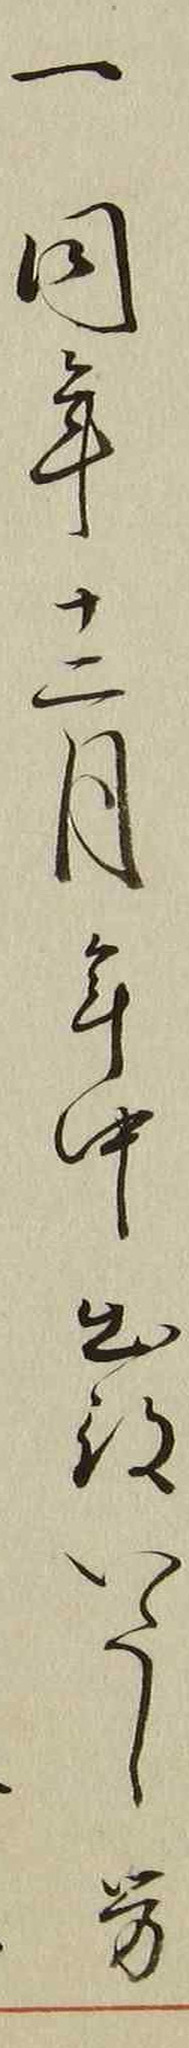一同年十二月年中出役いたし労
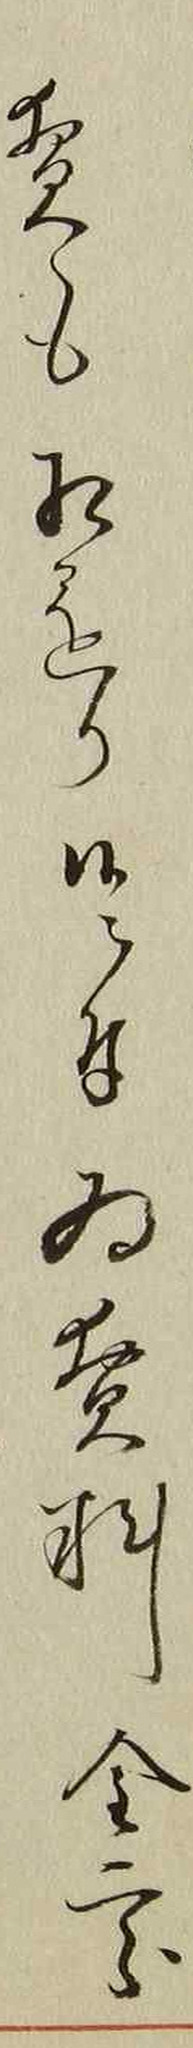費も相懸り候ニ付為費料金二分
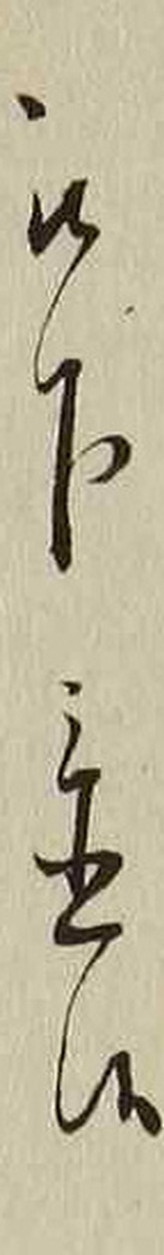被下置候
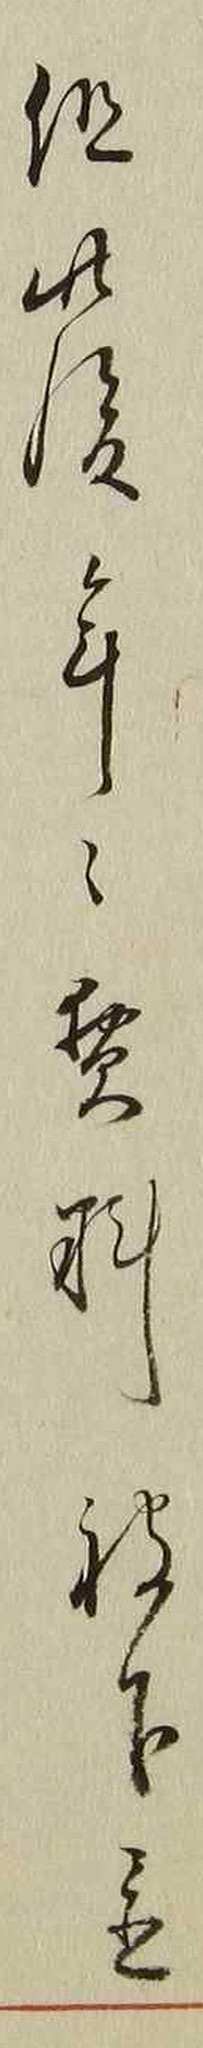但此後年々費料被下置
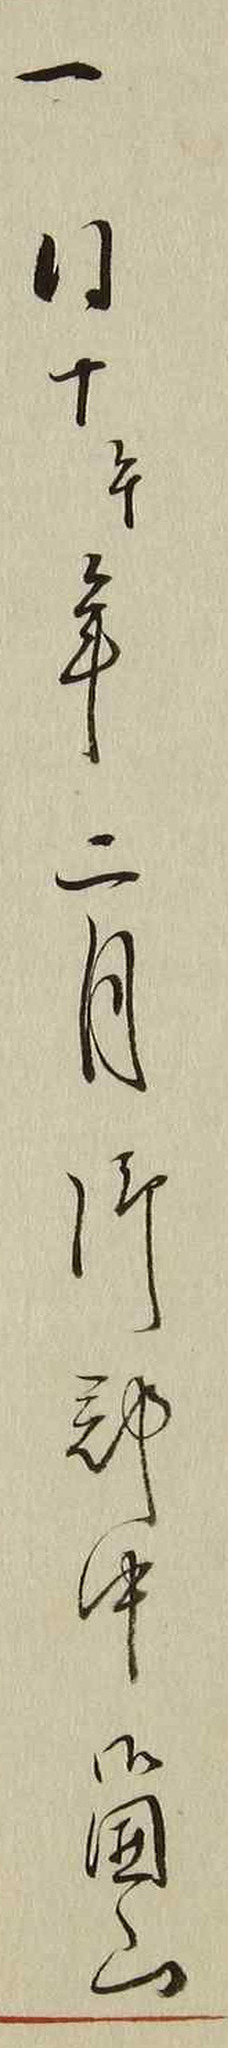一同十午年二月御部中御囲山
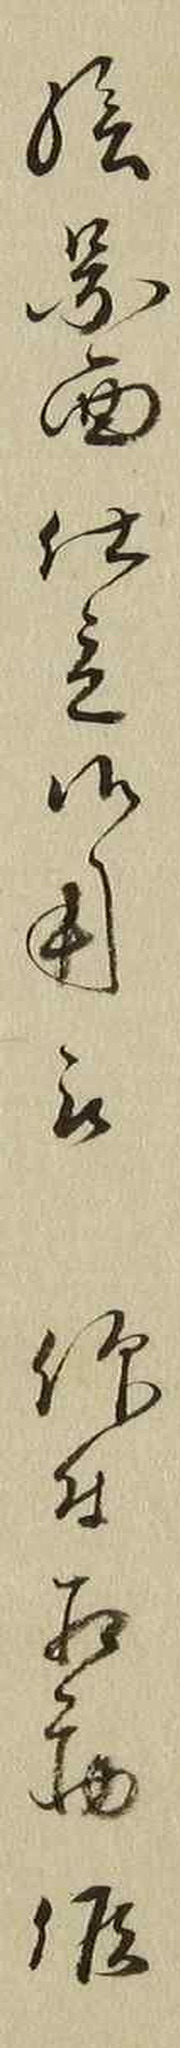絵図面仕立御用被仰付相勤候
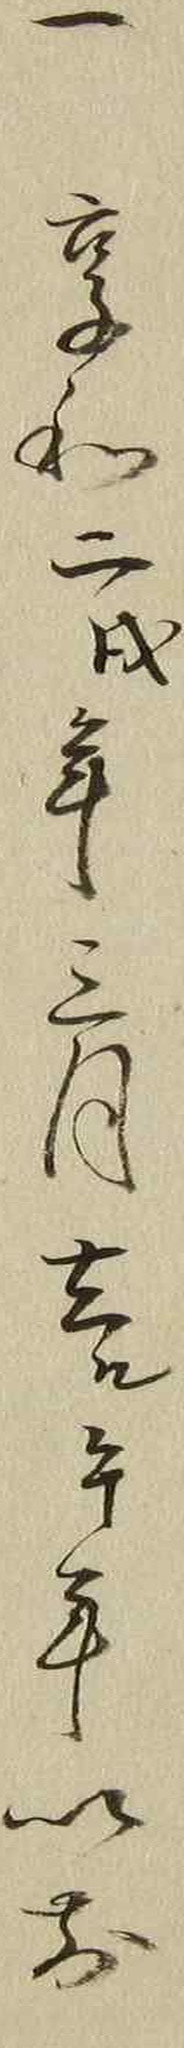一享和二戌年三月去ル午年以前
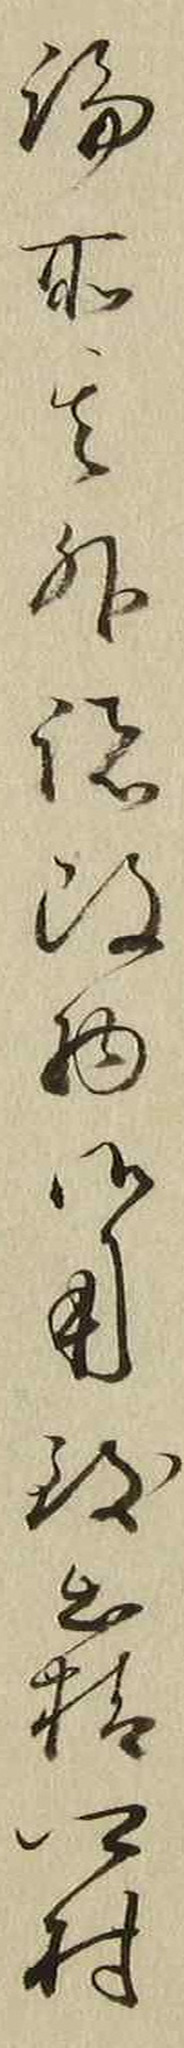論所其外諸改物御用致出精郷村
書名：諸士系譜　巻之32　い之部32
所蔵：会津若松市立会津図書館
